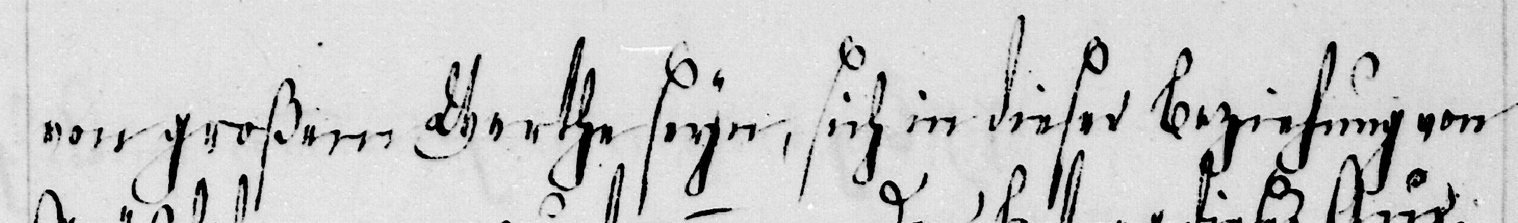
von großem Werthe seyn, sich in dieser Beziehung von
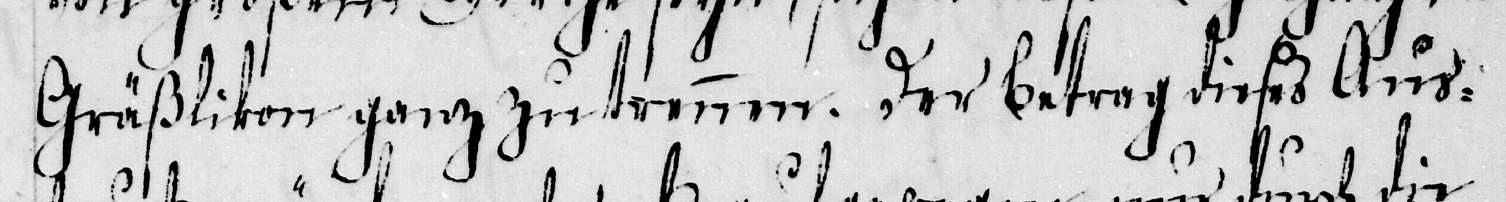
Gräßlikon ganz zu trennen. Der Betrag dieses Aus¬
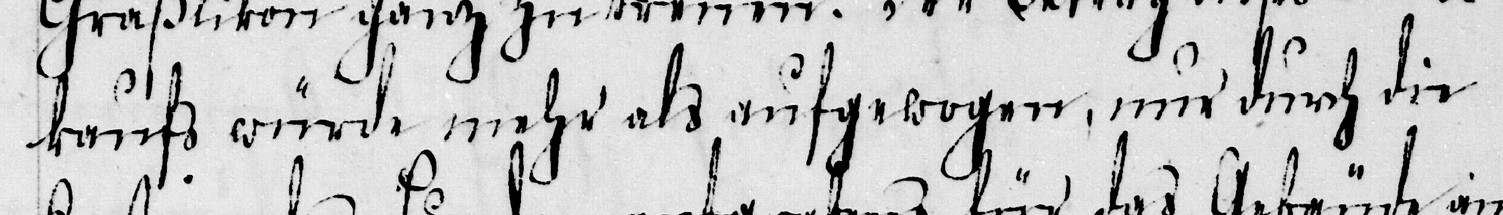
kaufs würde mehr als aufgewogen, nur durch die
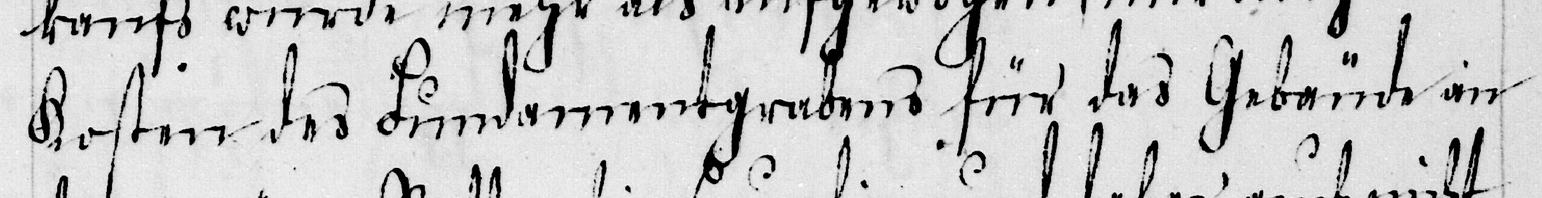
Kosten des Fundamentgrabens für das Gebäude an
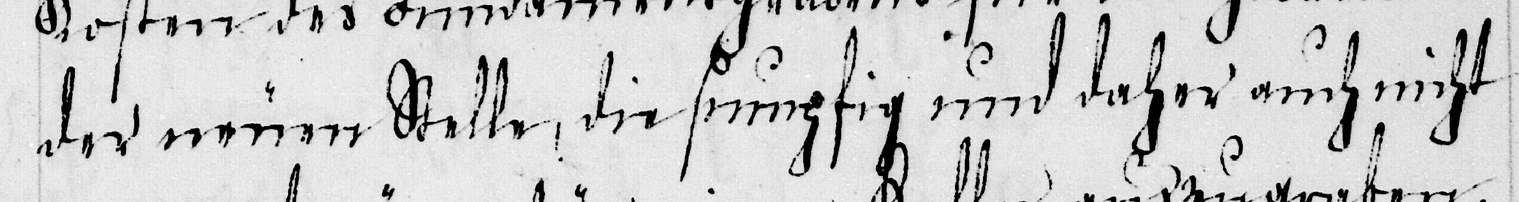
der neuen Stelle, die sumpfig und daher auch nicht
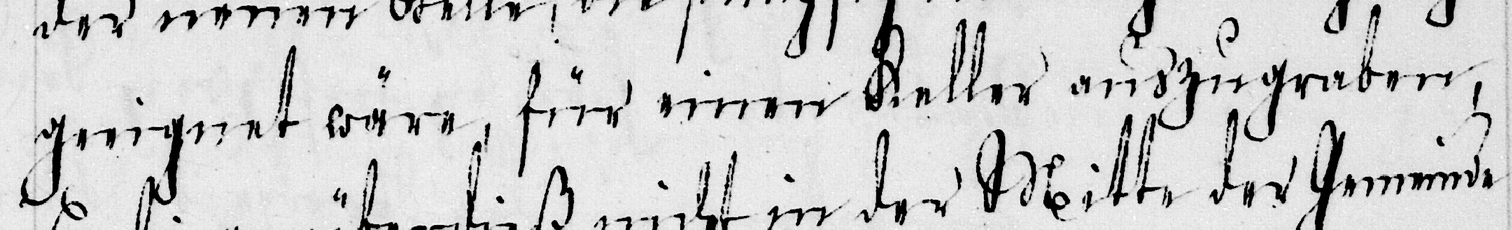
geeignet wäre, für einen Keller auszugraben,
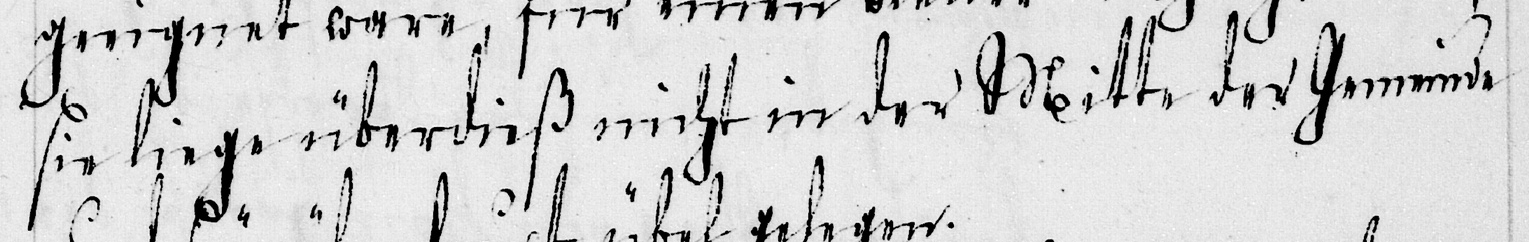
sie liege überdieß nicht in der Mitte der Gemeinde
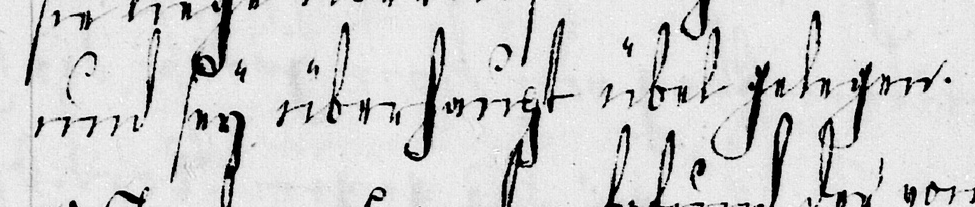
und sey überhaupt übel gelegen.
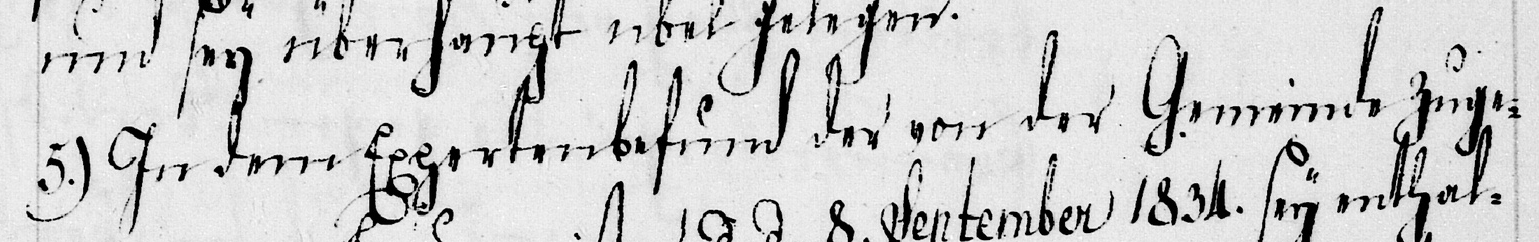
5.) In dem Expertenbefund der von der Gemeinde zuge¬
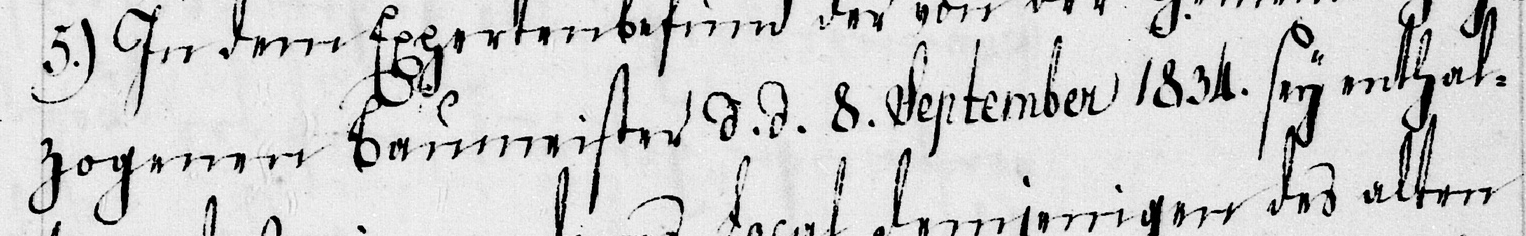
zogenen Baumeister d. d. 8. September 1834. sey enthal¬
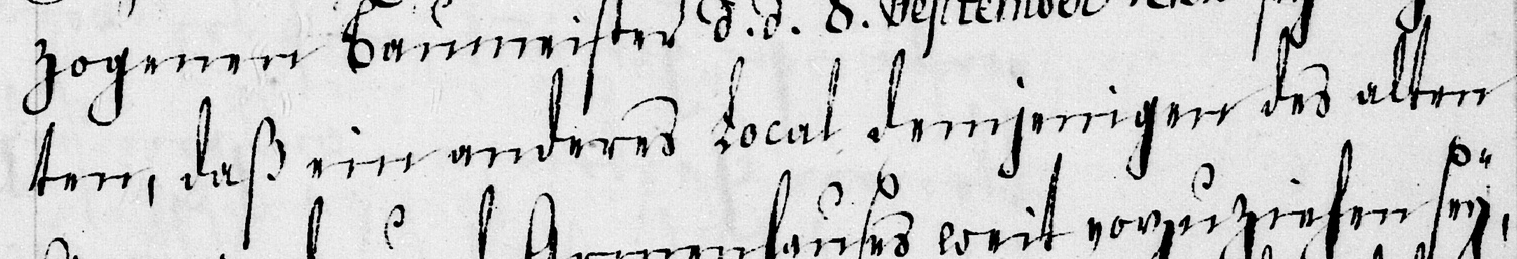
ten, daß ein anderes Local demjenigen des alten
